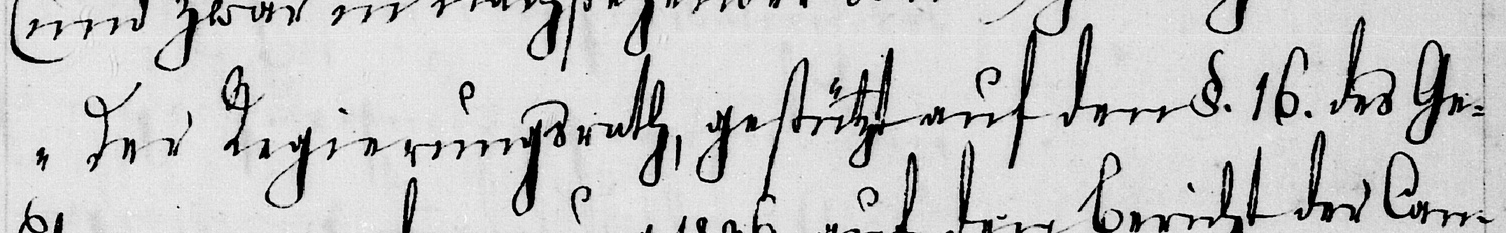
„ Der Regierungsrath, gestützt auf den §. 16. des Ge¬
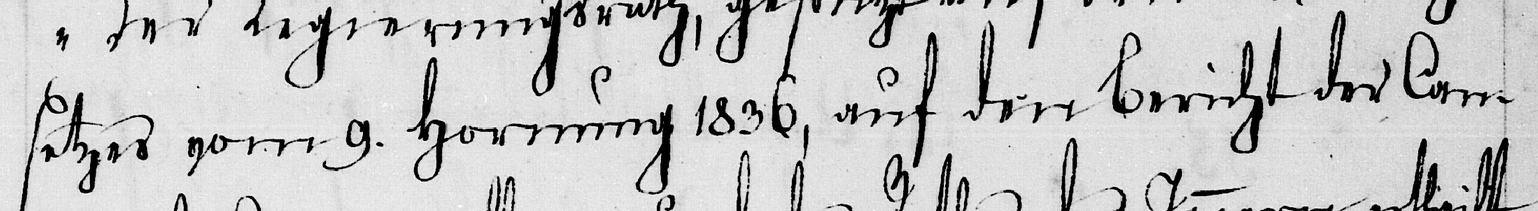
setzes vom 9. Hornung 1836, auf den Bericht der Can¬
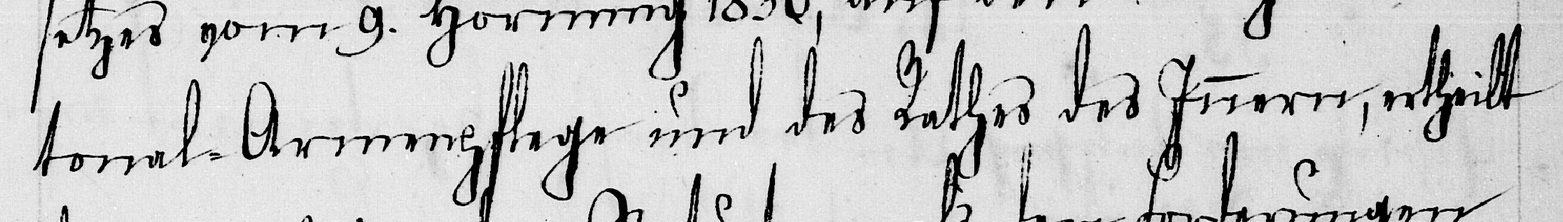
tonal-Armenpflege und des Rathes des Innern, ertheilt
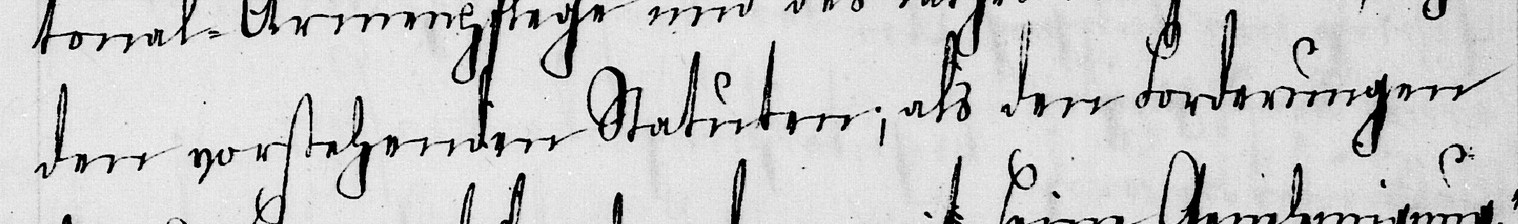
den vorstehenden Statuten; als den Forderungen
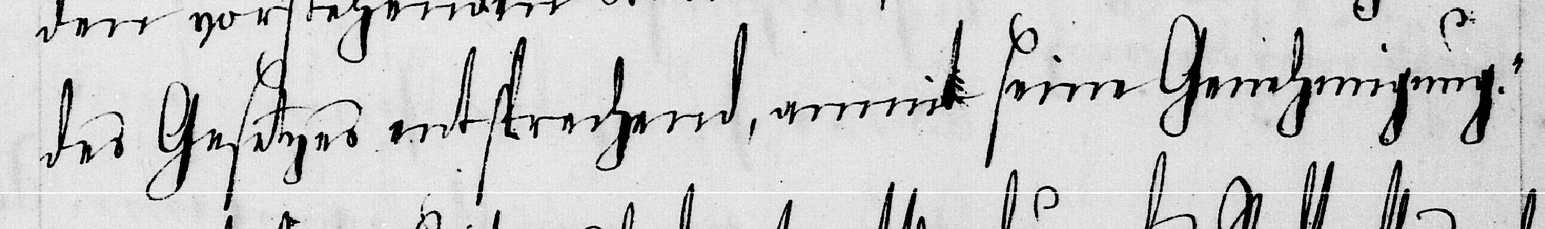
des Gesetzes entsprechend, anmit seine Genehmigung.
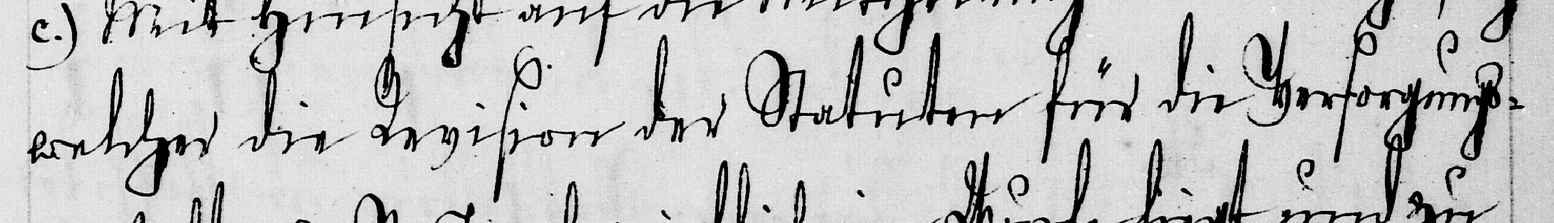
welcher die Revision der Statuten für die Versorgungs¬
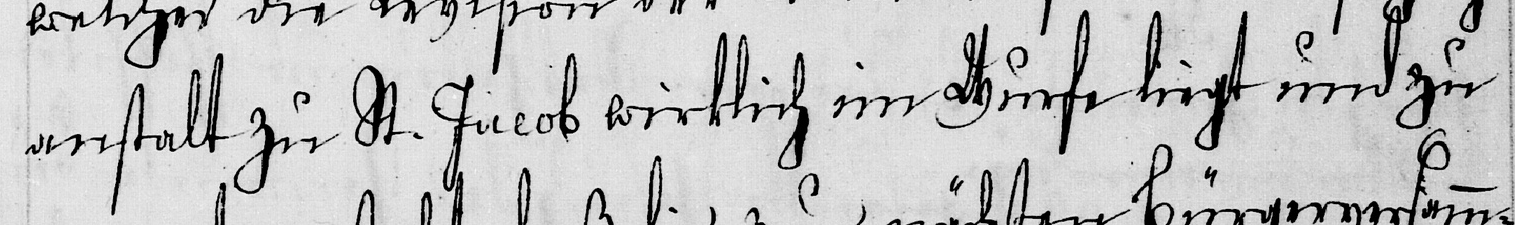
anstalt zu St. Jacob wirklich im Wurfe liegt und zu
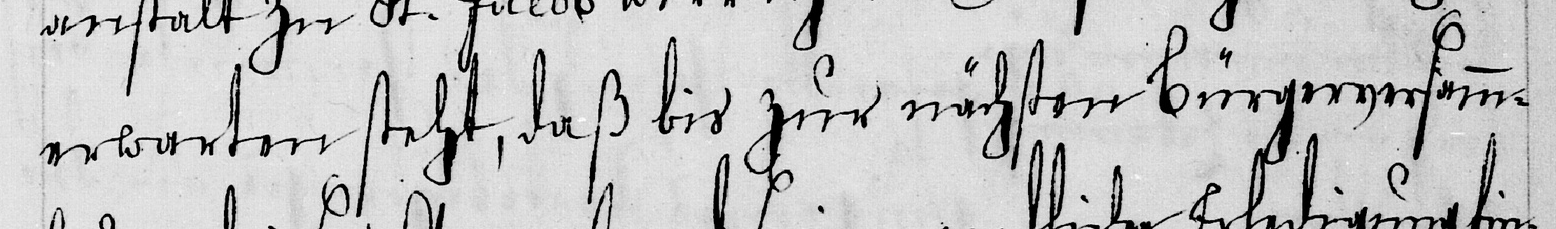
erwarten steht, daß bis zur nächsten Bürgerversamm¬
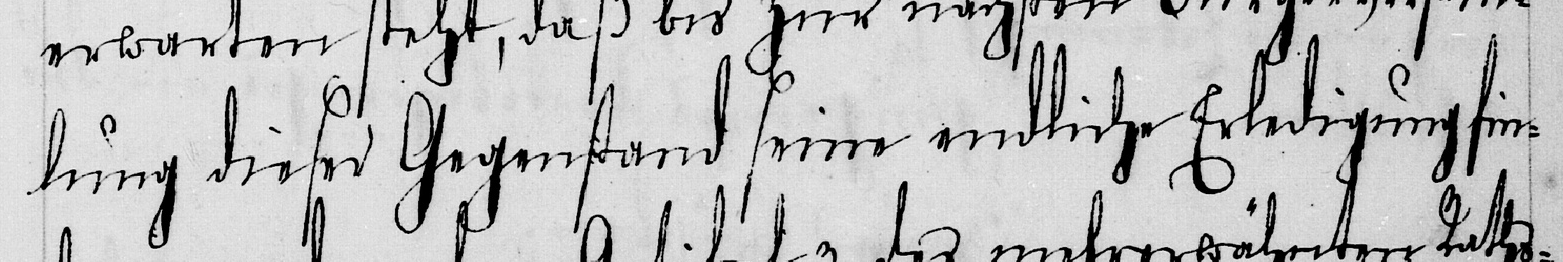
lung dieser Gegenstand seine endliche Erledigung fi¬
